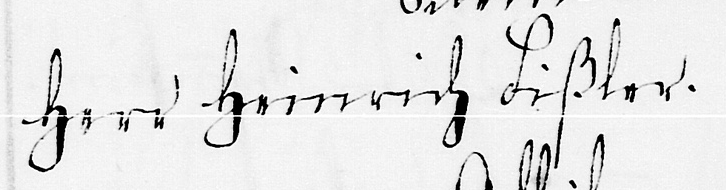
Herr Heinrich Fißler.
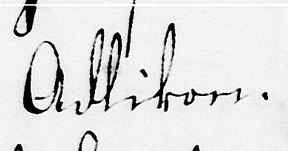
Adlikon.
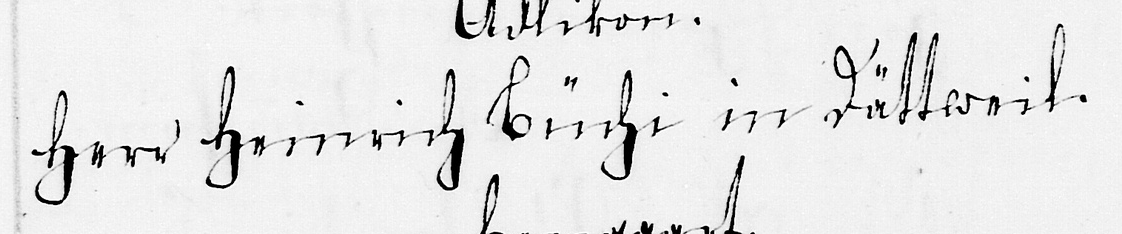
Herr Heinrich Büchi in Dättweil.
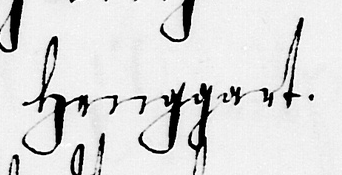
Henggart.
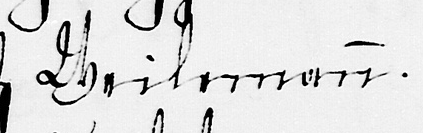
Weilemann.
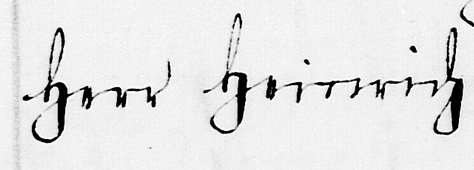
Herr Heinrich
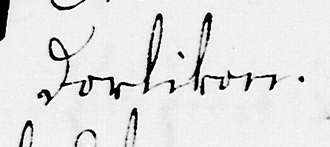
Dorlikon.
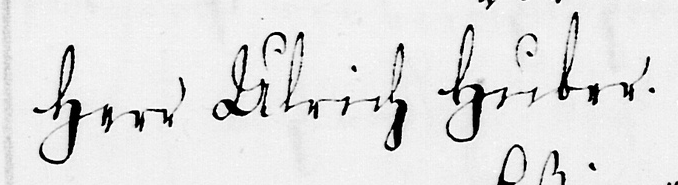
Herr Ulrich Huber.
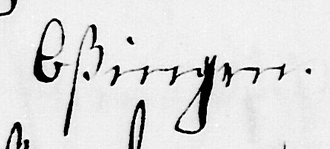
Oßingen.
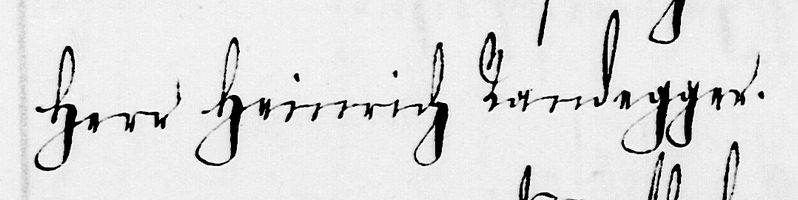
Herr Heinrich Randegger.
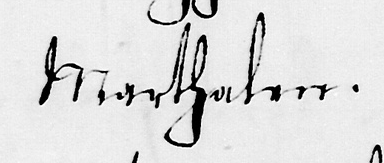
Marthalen.
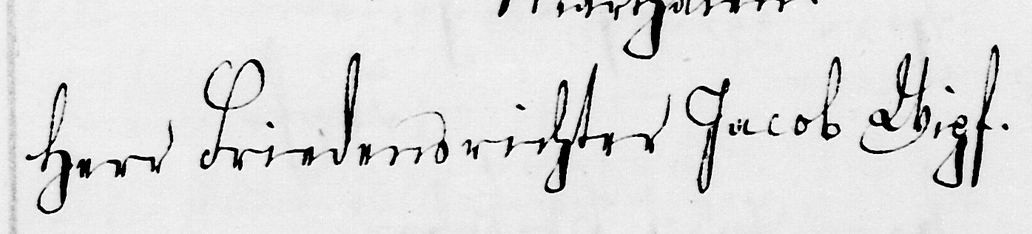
Herr Friedensrichter Jacob Wipf.
